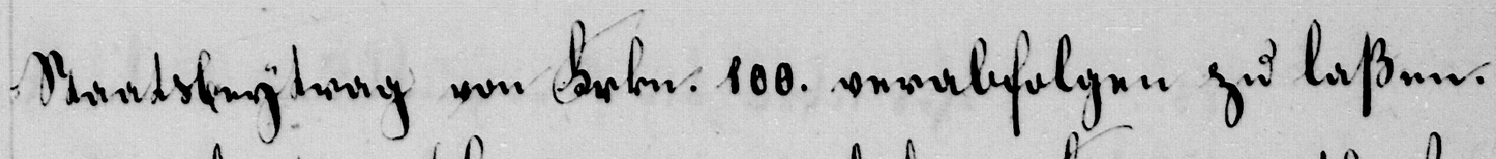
Staatsbeytrag von Frkn. 100. verabfolgen zu laßen.
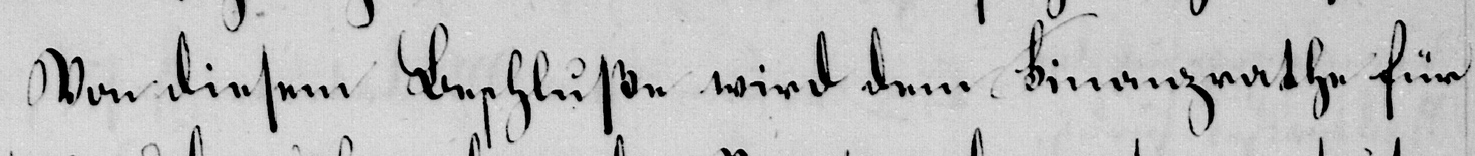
Von diesem Beschluße wird dem Finanzrathe für
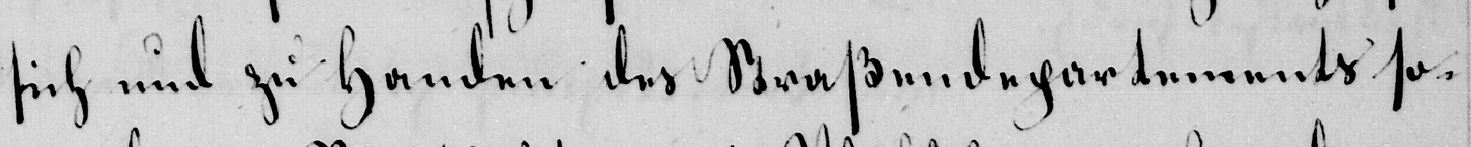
sich und zu Handen des Straßendepartements so¬
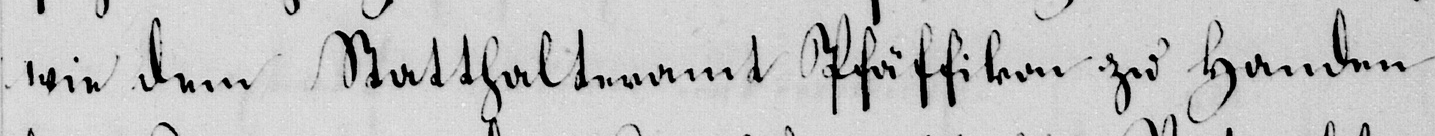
wie dem Statthalteramt Pfäffikon zu Handen
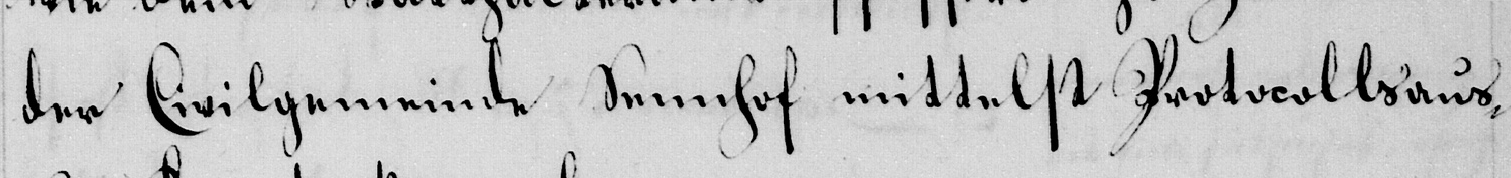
der Civilgemeinde Sennhof mittelst Protokollsaus¬
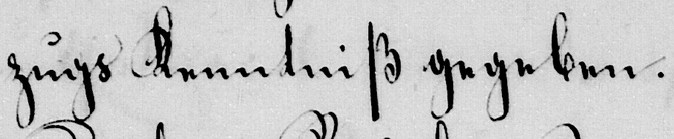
zugs Kenntniß gegeben.
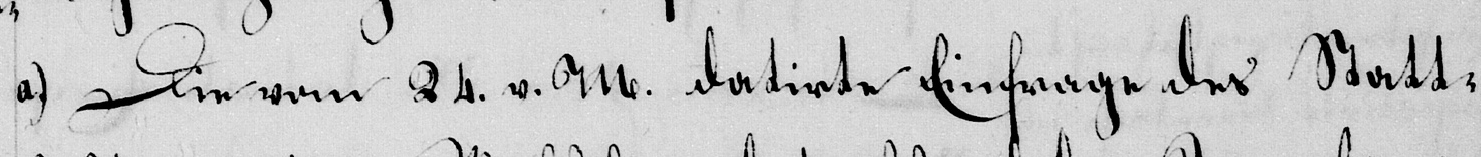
a.) Die vom 24. v. M. datirte Einfrage des Statt¬
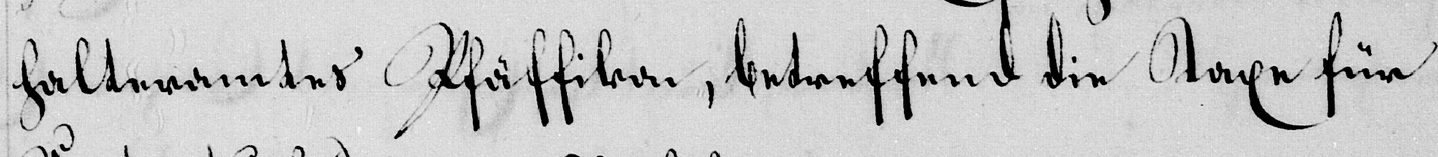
halteramtes Pfäffikon, betreffend die Taxe für
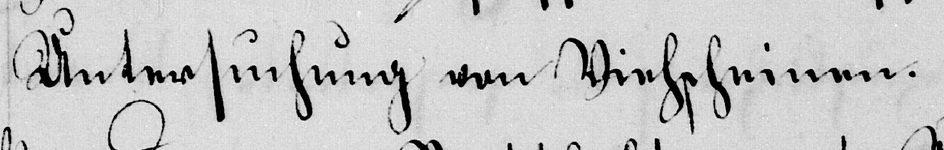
Untersuchung von Viehscheinen.
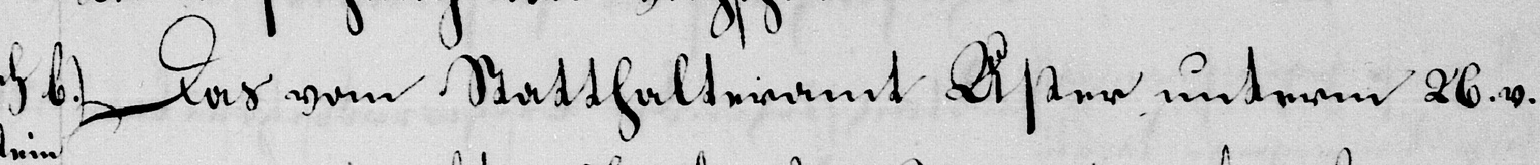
b.) Das vom Statthalteramt Uster unterm 26. v.
